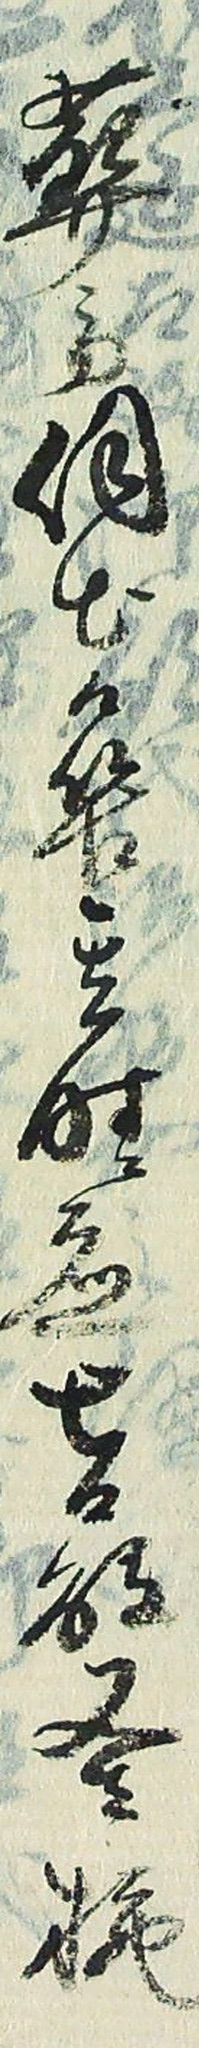葬方伺出候筈其時ニ應七日触又者椀
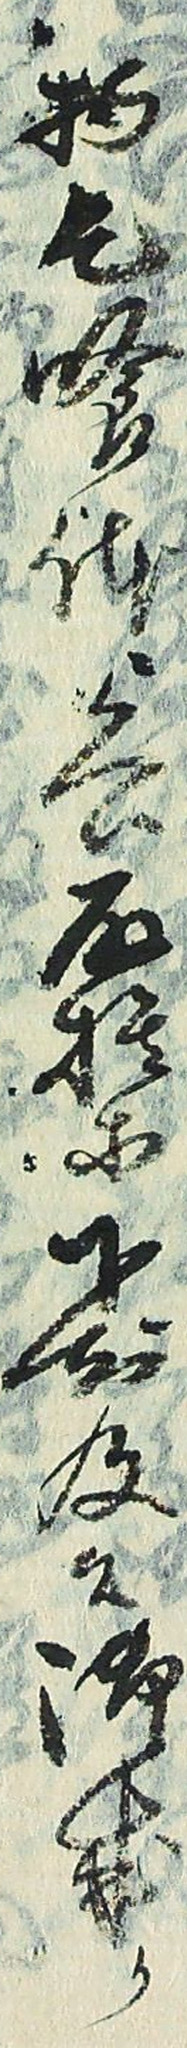物乞喰体ニ候へハ取捨等下知及候御成り
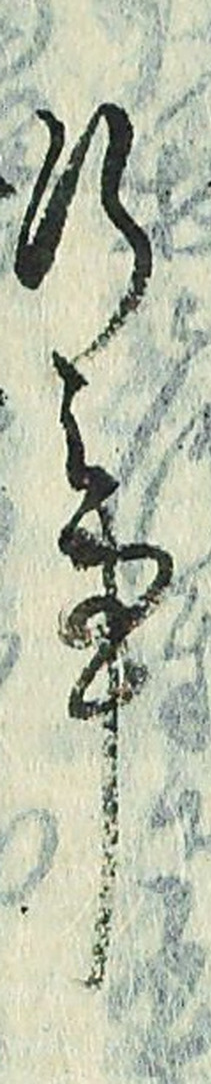行之事
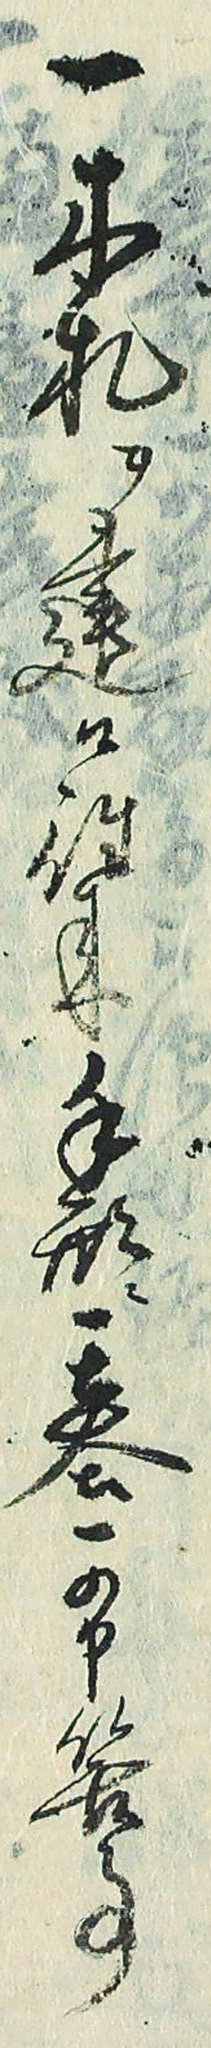一木札ヲ建候往来手形ニ基可申筈事
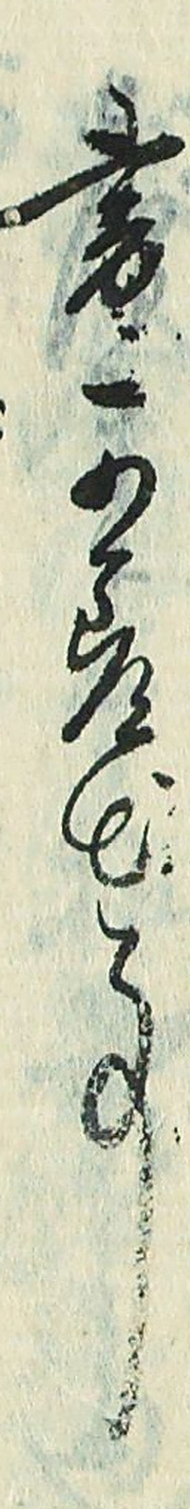書可差出事
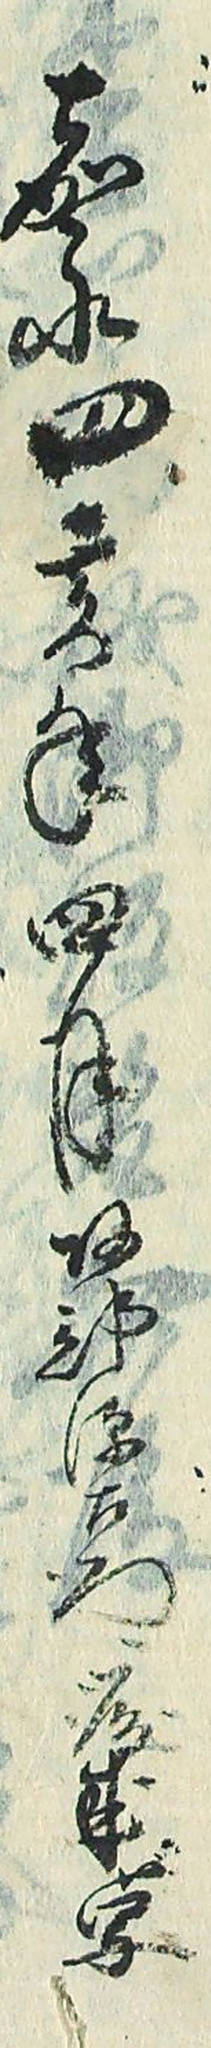嘉永四亥年四月阿部源右衛門へ御渡成写

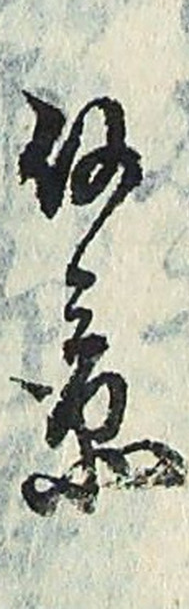何兵衛
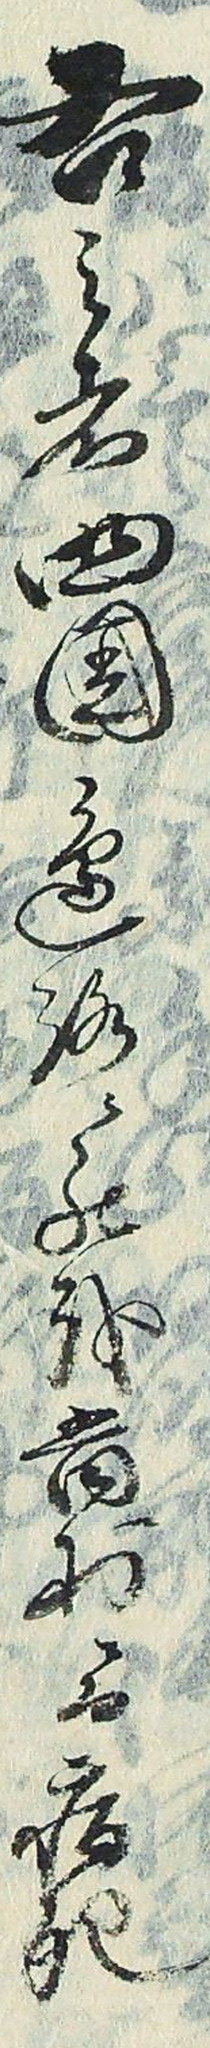右之者四国邊路ニ罷越當村ニ而病死
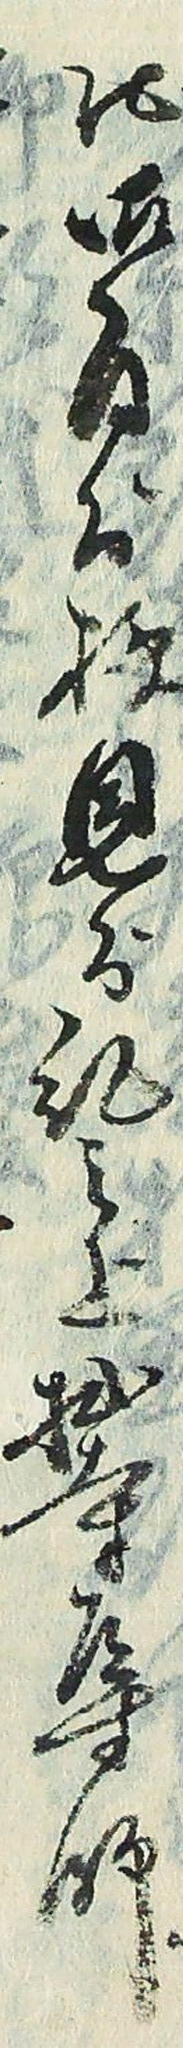仕御自分様見分糺之上拙寺導師
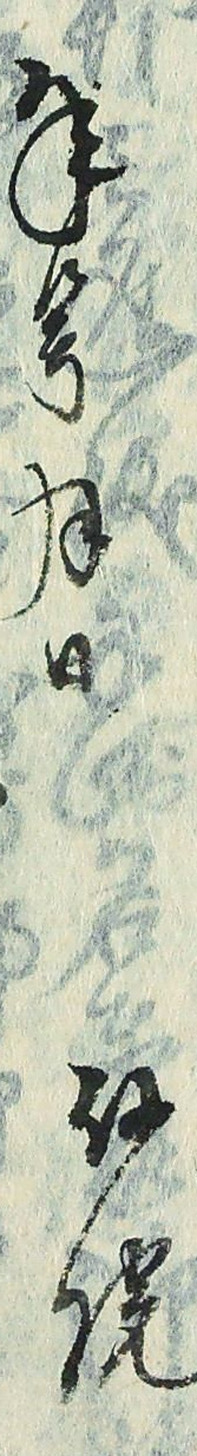年号月日何院
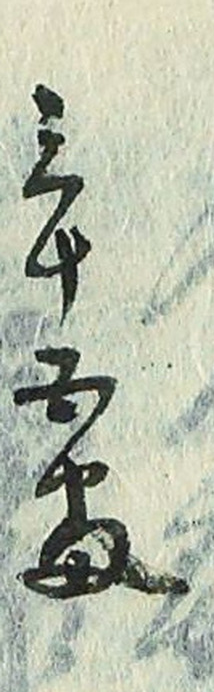三十五番
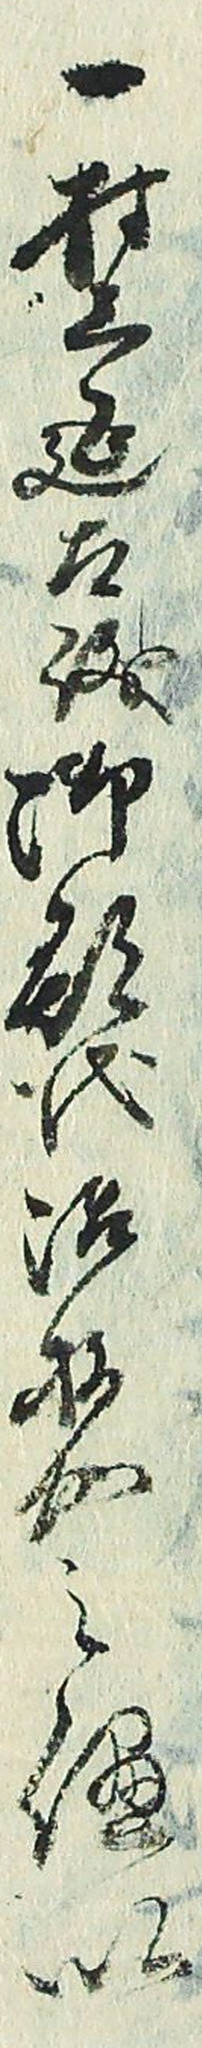一村上延太儀御郡代御指加之儘以
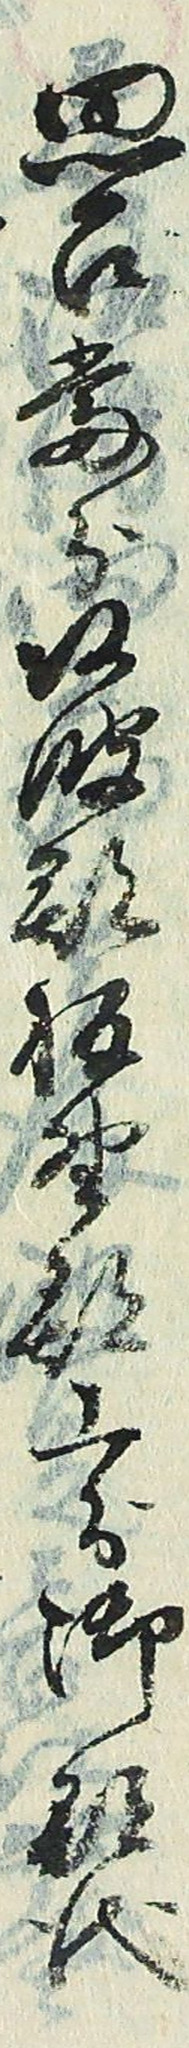思召當分阿波郡板野郡上分御郡代
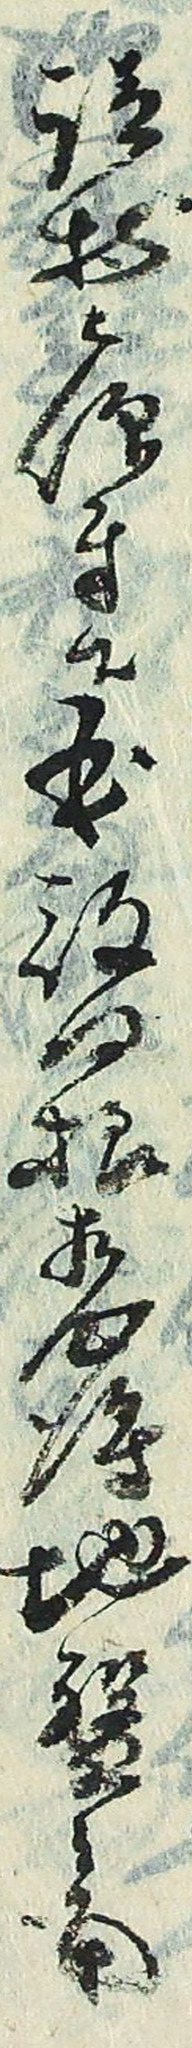請持被仰付候本役同様相心得地盤之御用
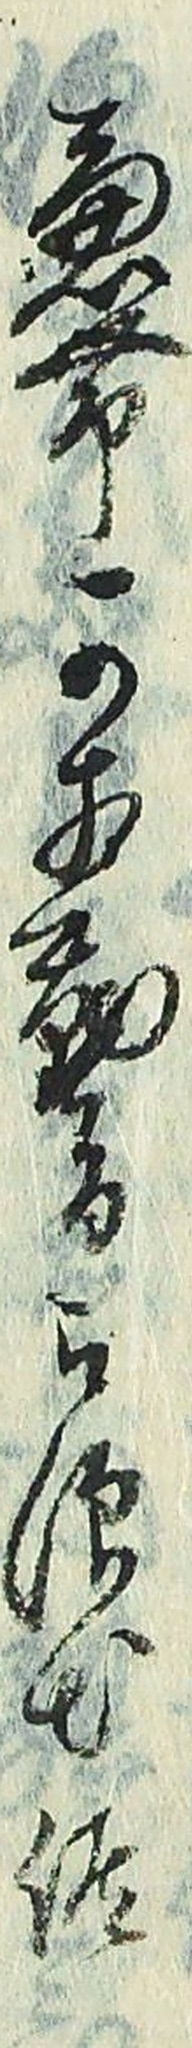兼帯可相勤旨被仰出候
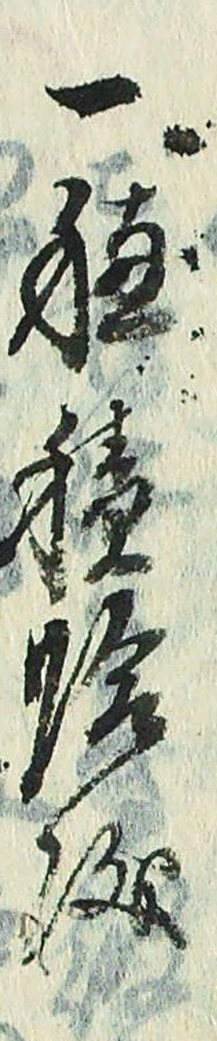一穂積恰儀
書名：諸御趣意書并御下知向之写
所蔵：鳴門教育大学 Naruto University of Education
